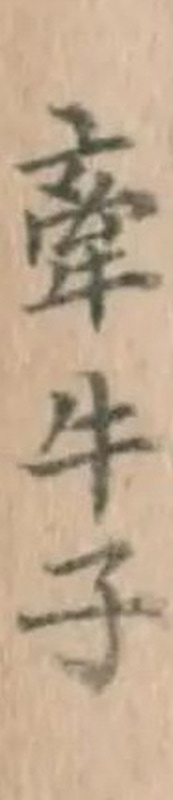牽牛子

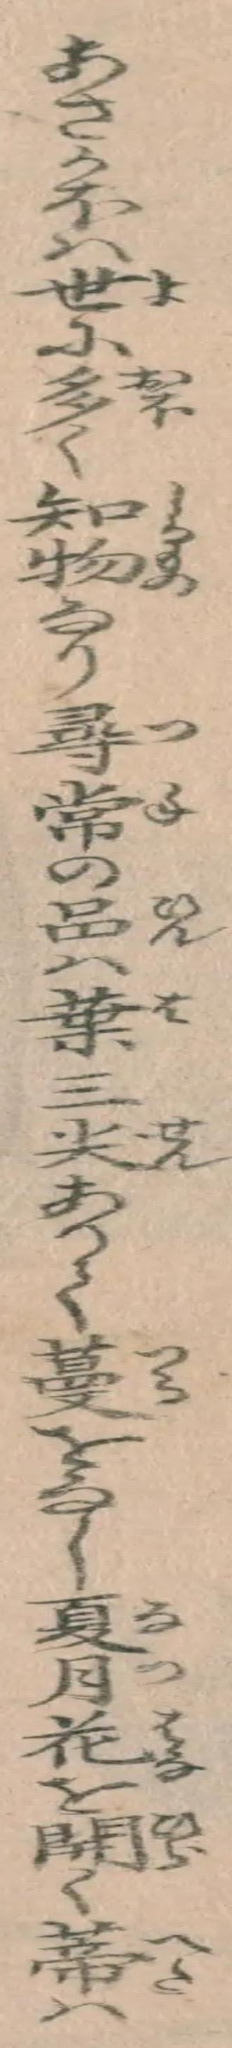あさかほは世に多く知物なり尋常の品は葉三尖ありて蔓をなし夏月花を開く蒂は
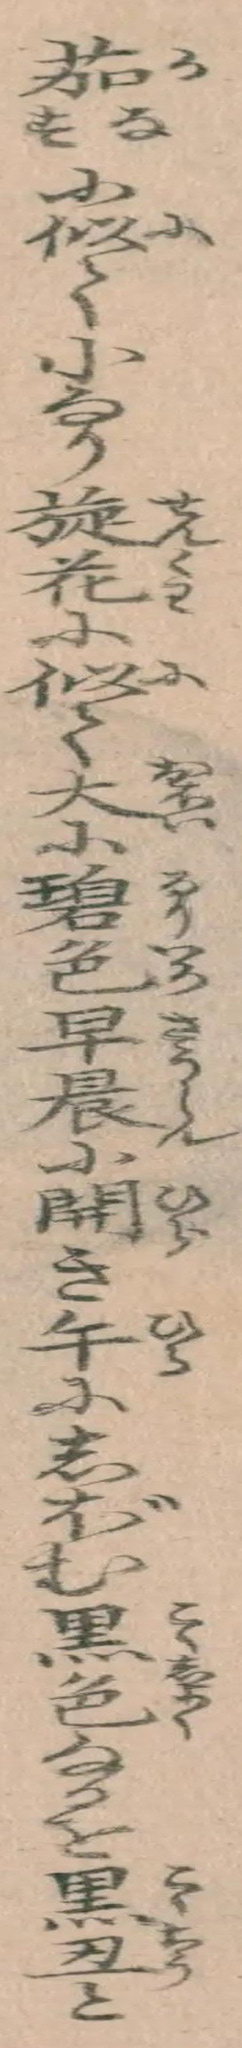茄なすに似て小なり旋花に似て大に碧色早晨に開き午にしぼむ黒色なるを黒丑と
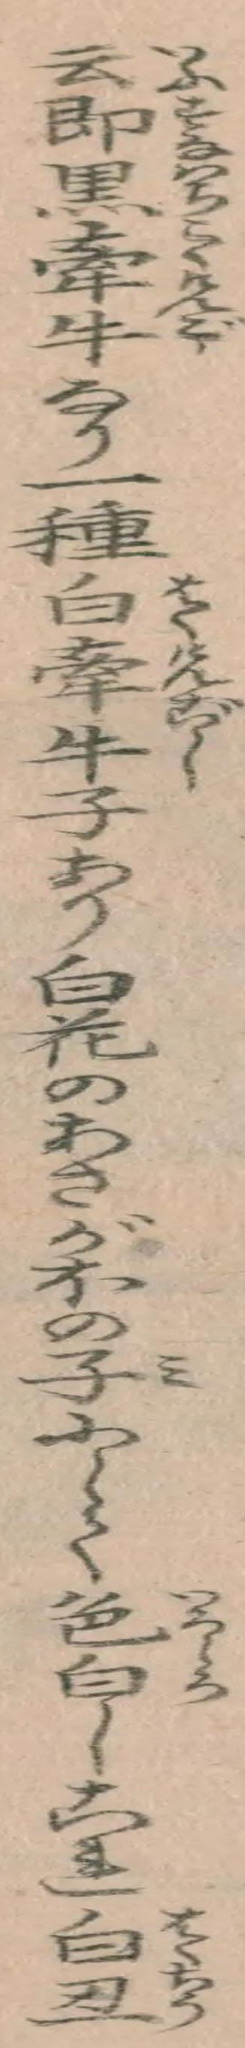云即黒牽牛なり一種白牽牛子あり白花のあさがほの子にして色白しこれ白丑
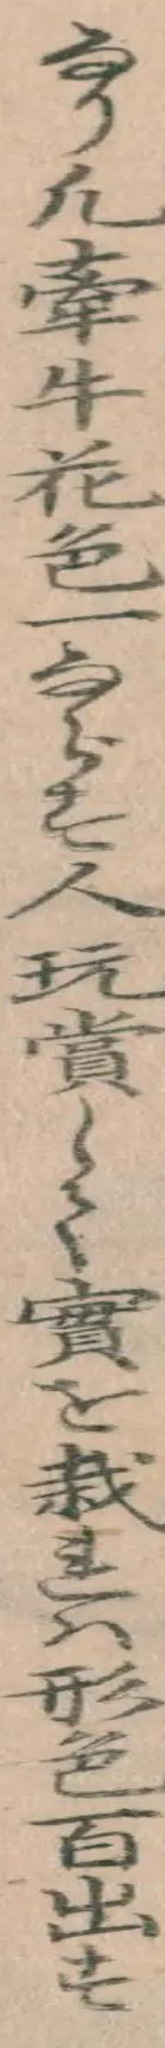なり凡牽牛花色一ならす人玩賞して実を栽れは形色百出す
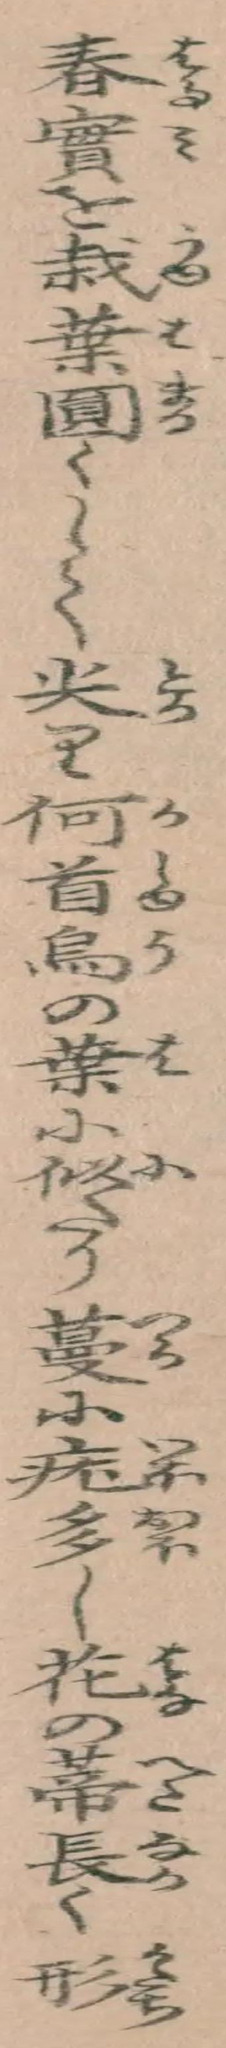春実を栽葉円くして尖り何首烏の葉に似たり蔓に疣多し花の蒂長く形
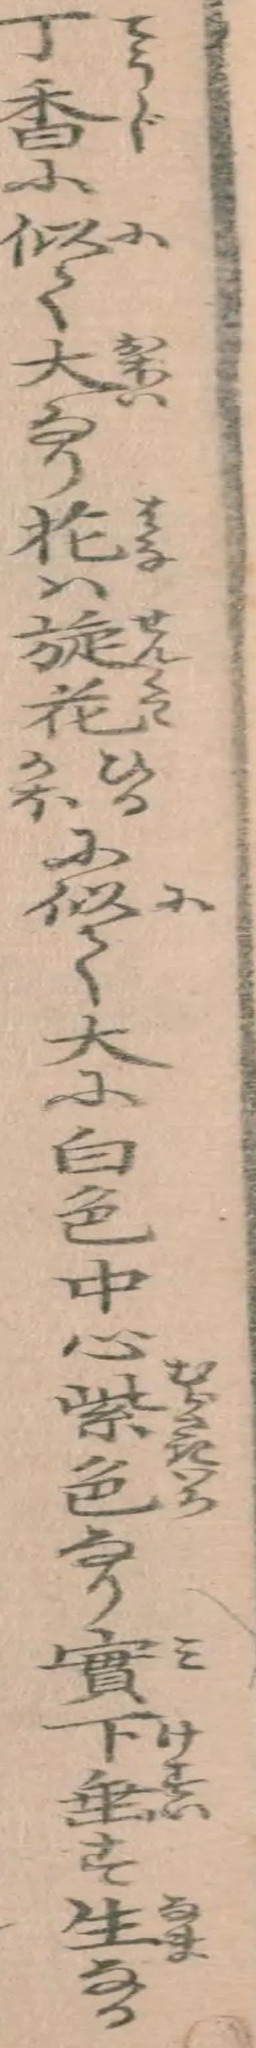丁香に似て大なり花は旋花ひるかほに似て大に白色中心紫色なり実下垂す生なる
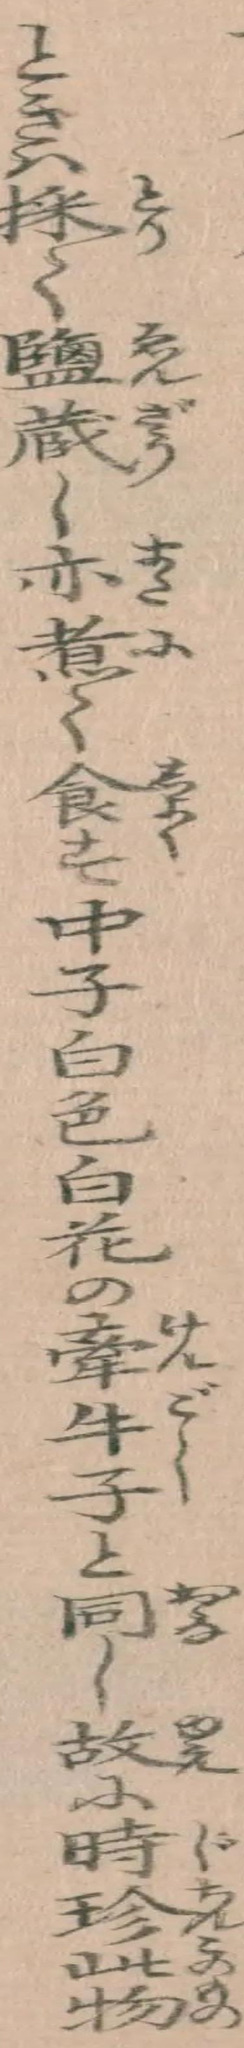ときは採て塩蔵し亦煮て食す中子白色白花の牽牛子と同し故に時珍此物

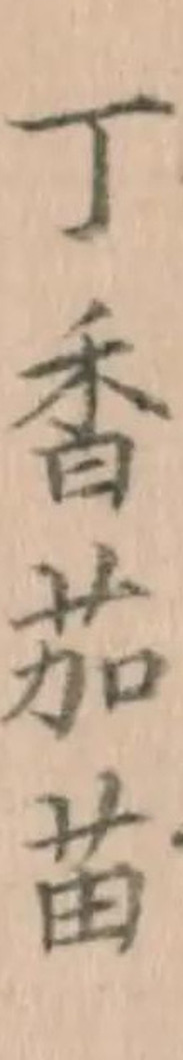丁香茄苗

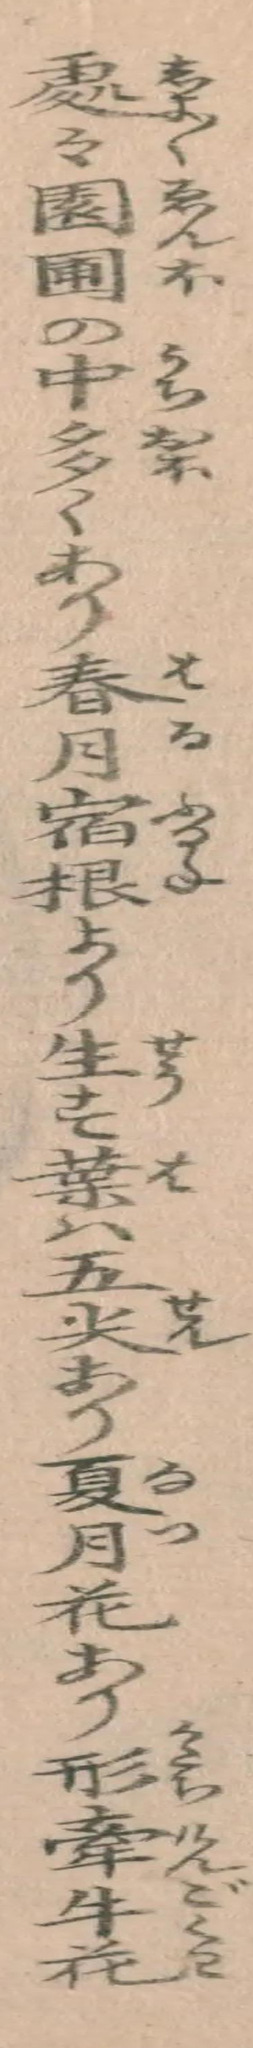処々園圃の中多くあり春月宿根より生す葉は五尖あり夏月花あり形牽牛花
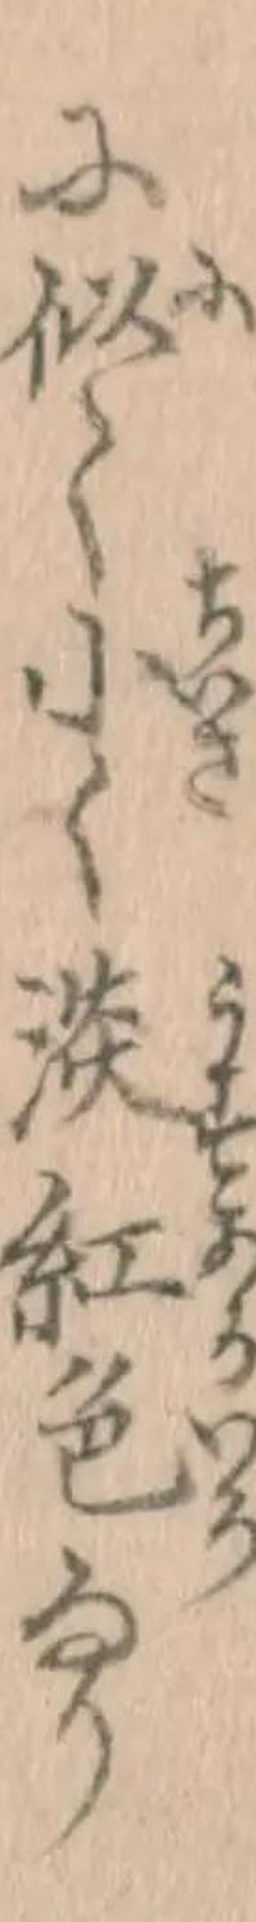に似て小く淡紅色なり
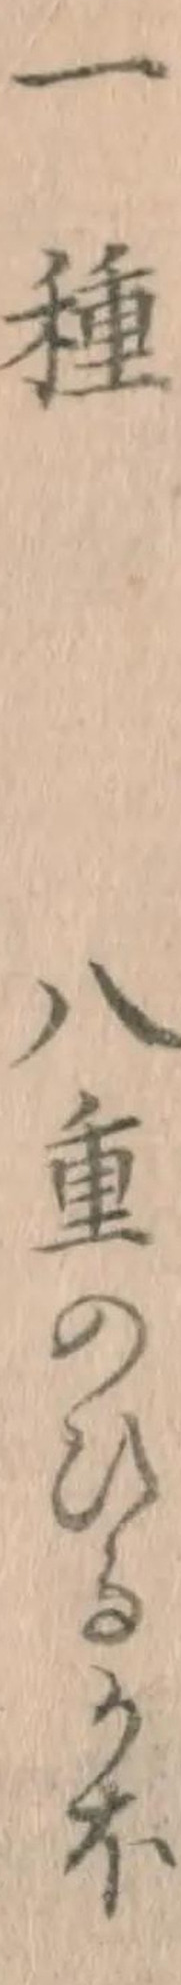一種八重のひるかほ
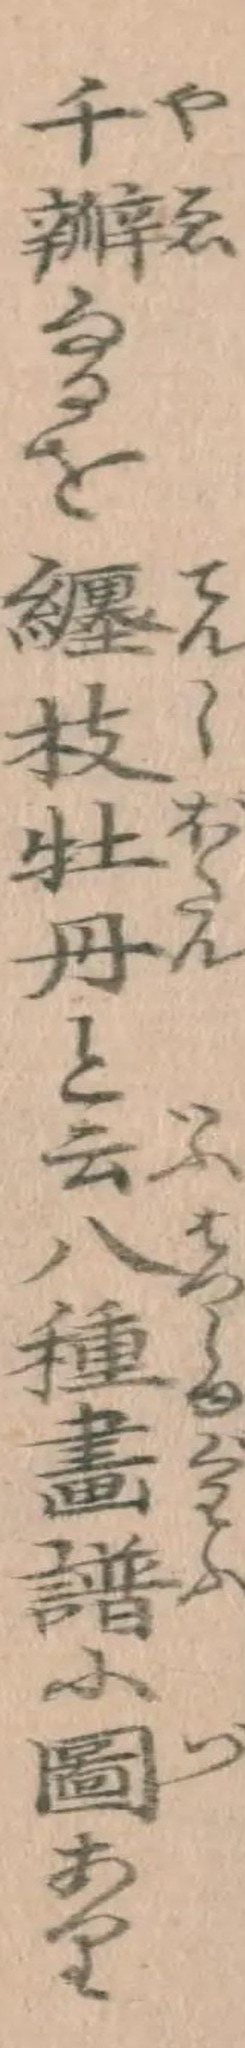千弁なるを纏枝牡丹と云八種画譜に図あり
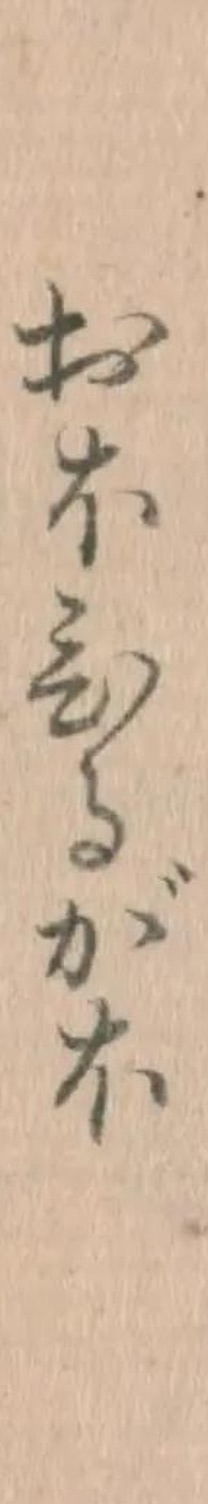一種はまひるがほ
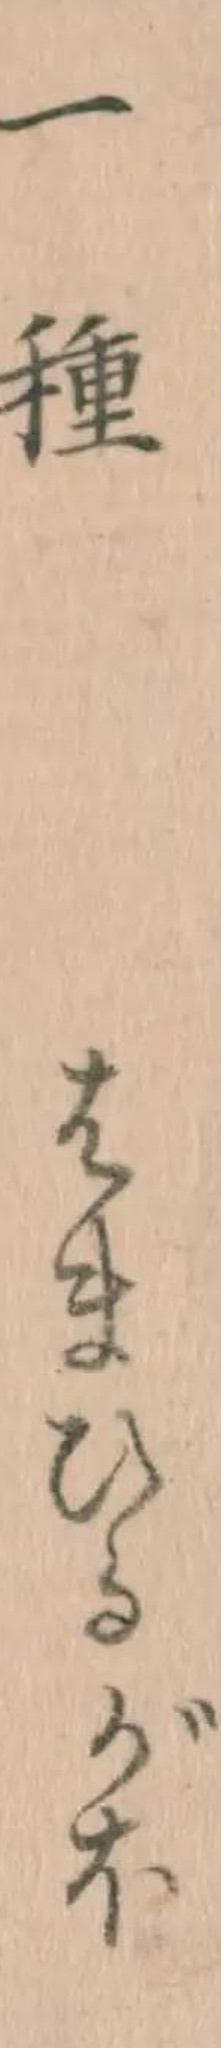一種はまひるがほ
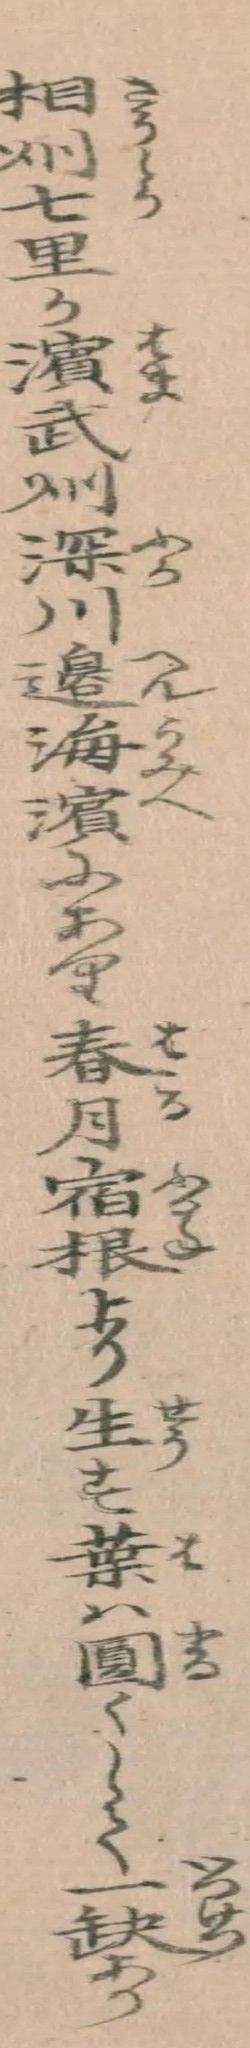相州七里か浜武州深川辺海浜にあり春月宿根より生す葉は円くして一欠あり
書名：本草図譜. 巻25-27
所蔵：国立国会図書館 National Diet Library, JAPAN
